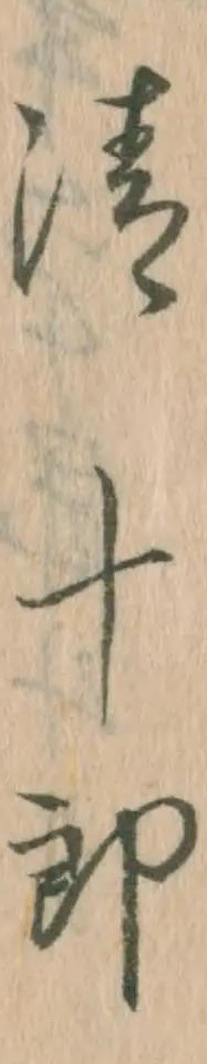清十郎
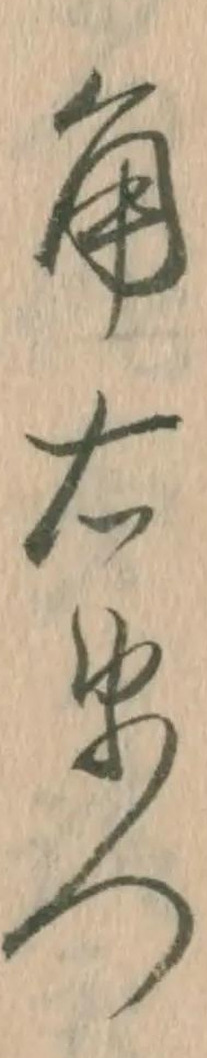次右衛門
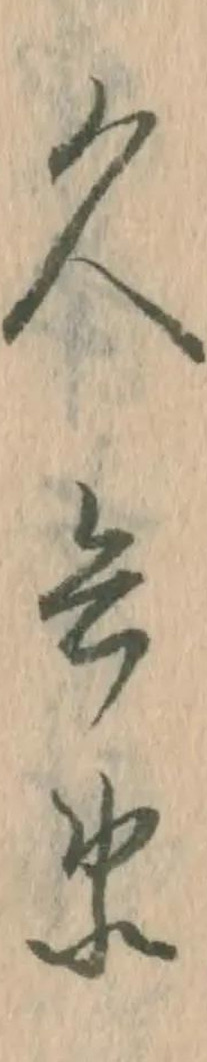久兵衛
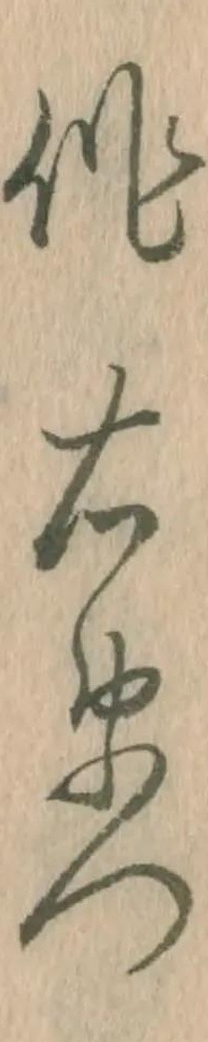作右衛門
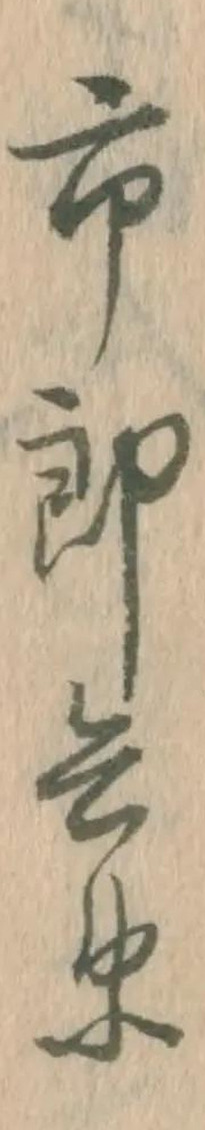太郎兵衛
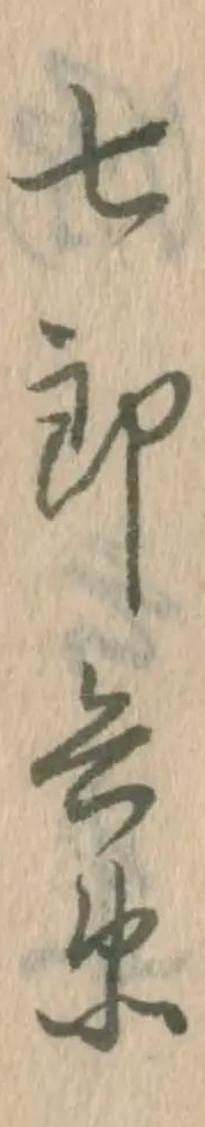七郎兵衛
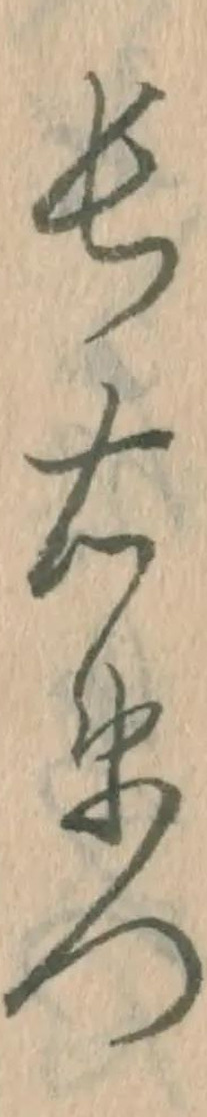次右衛門
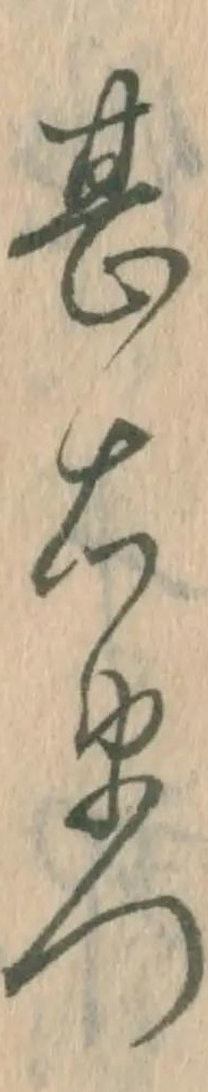甚右衛門
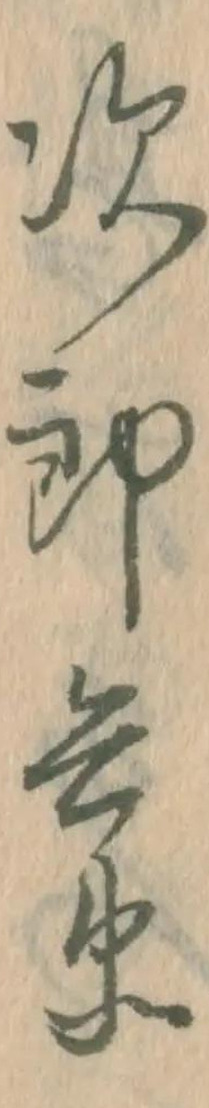次郎兵衛

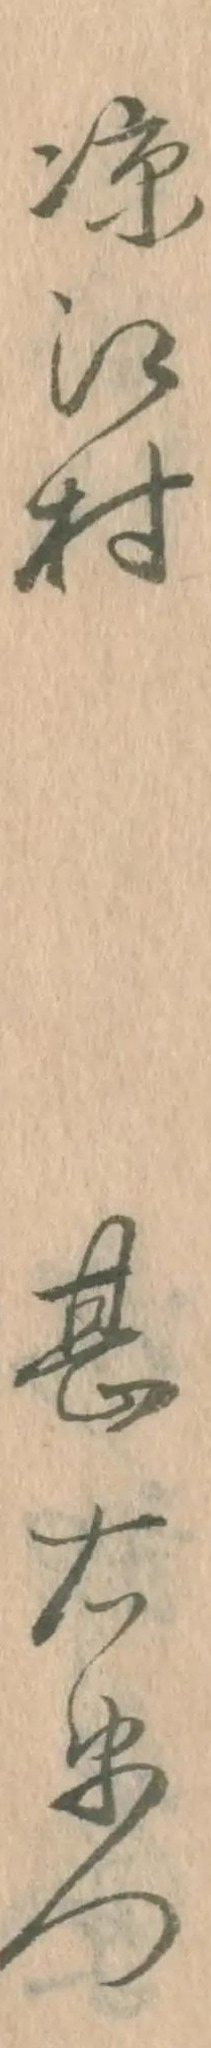涼江村甚右衛門
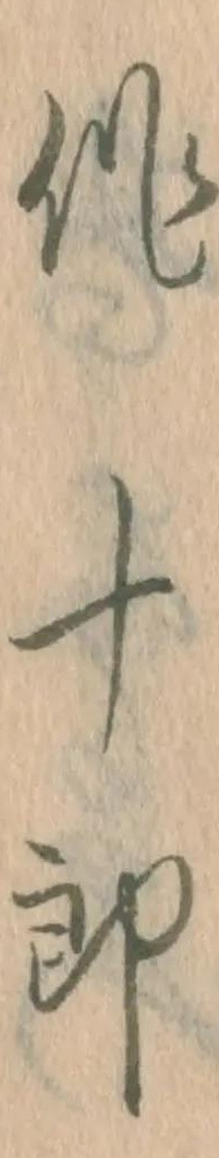作十郎
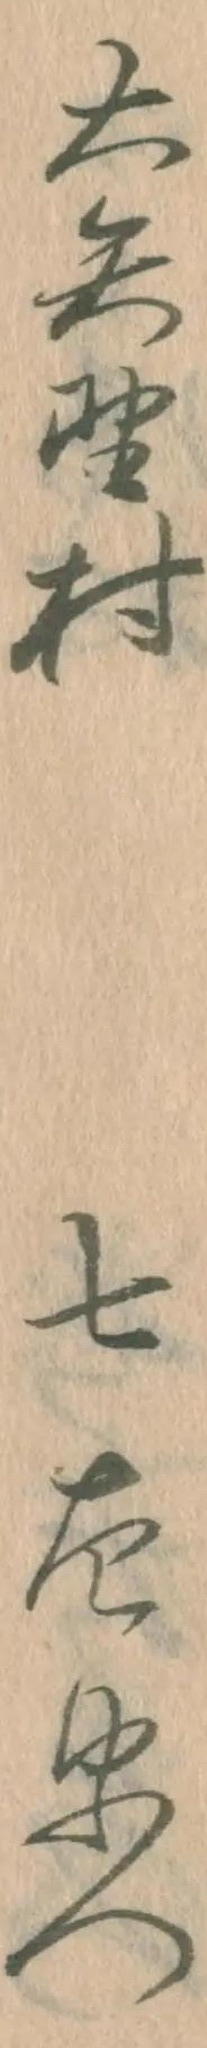大矢野村七左衛門
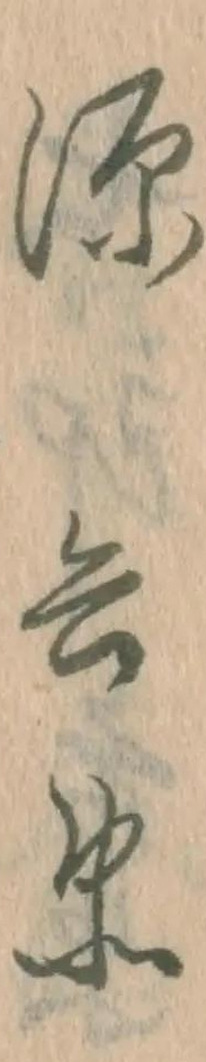源兵衛
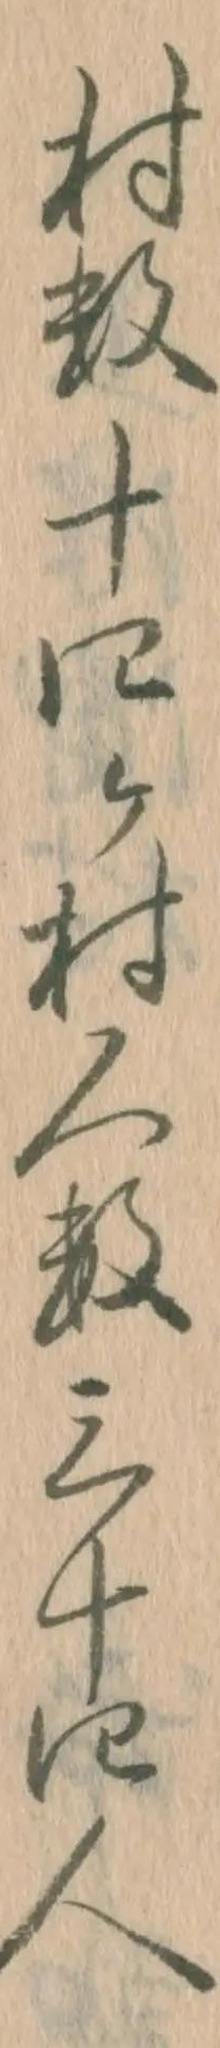村数十四け村人数三十四人
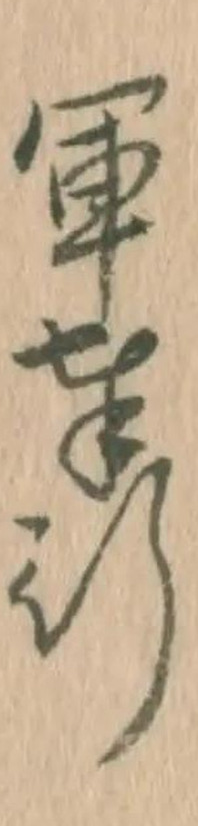軍奉行
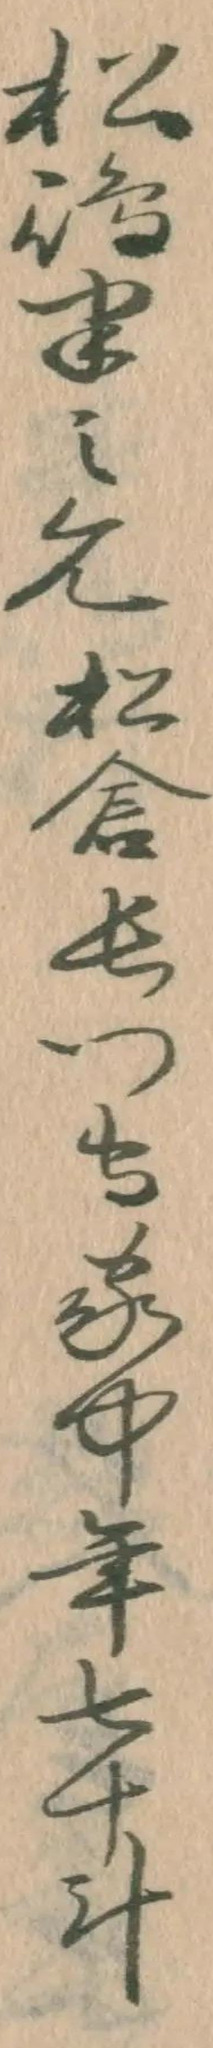松島半之允松倉長門守家中年七十斗
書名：切支丹御退治記 49巻. [9]
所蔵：国立国会図書館 National Diet Library, JAPAN
